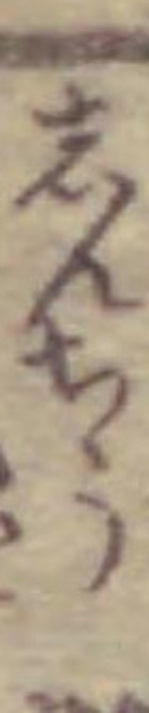しんちう
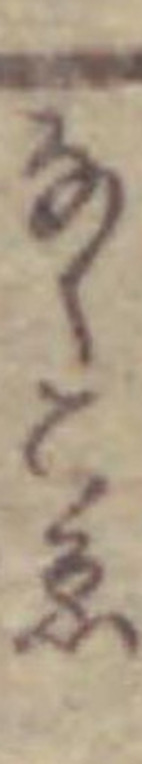なくこゑ
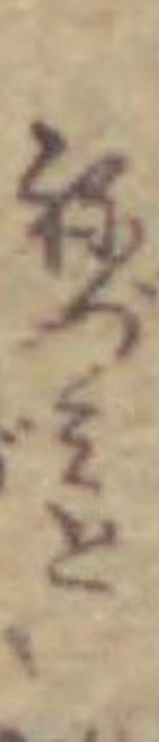ねづみと
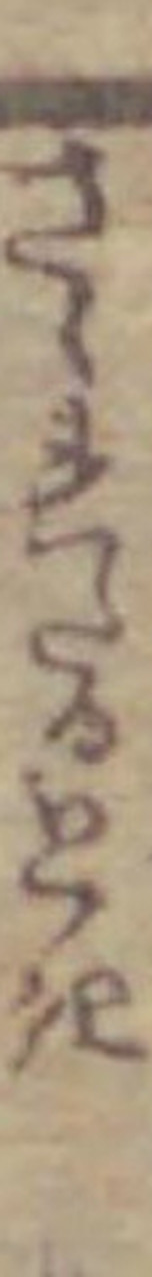さゝれたるとき
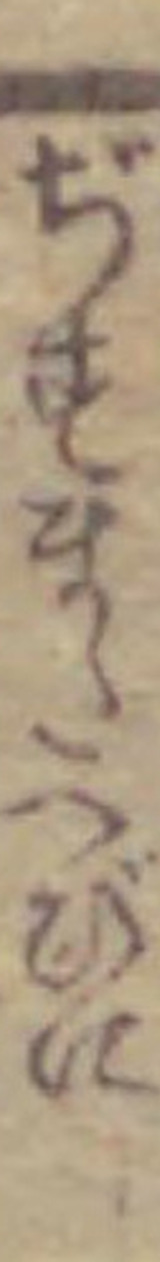ぢすまたへびに
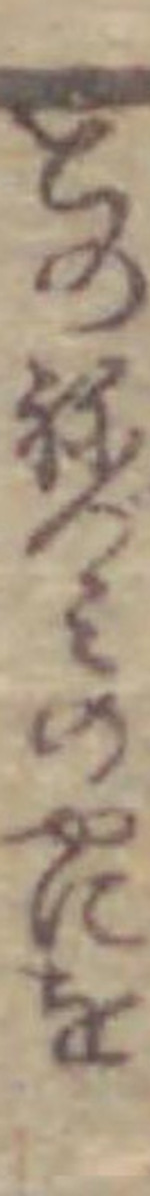このねづみのやにを
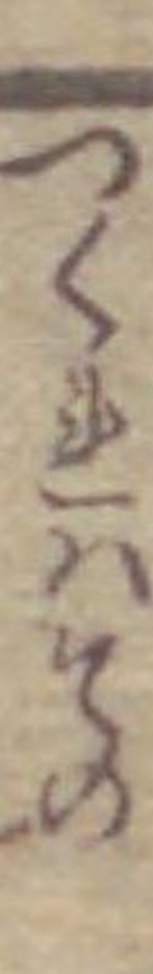つくれはその
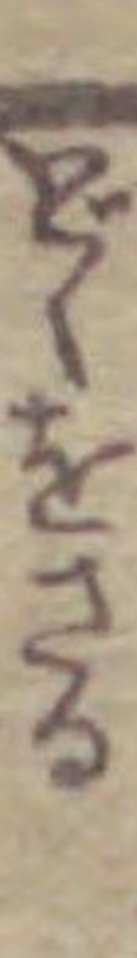どくをさる
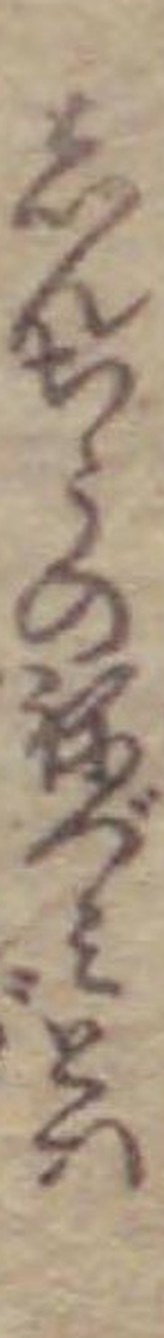しんちうのねづみとは
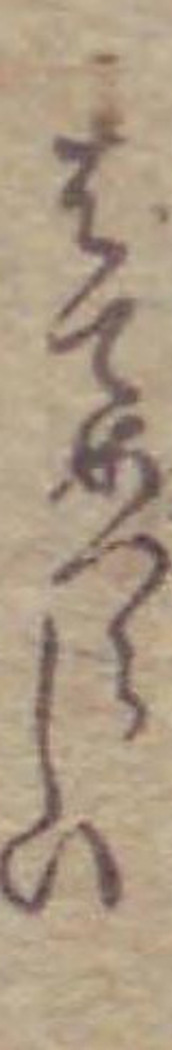はてめづらしい

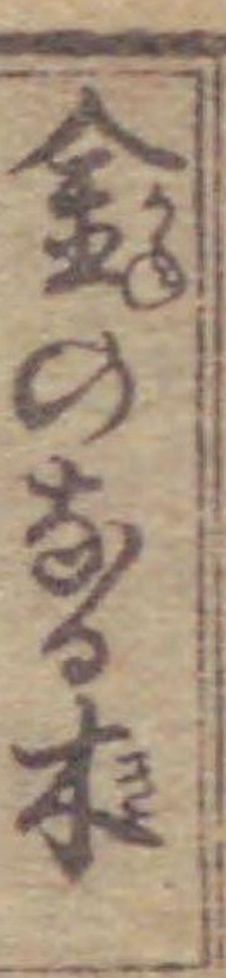金のなる木
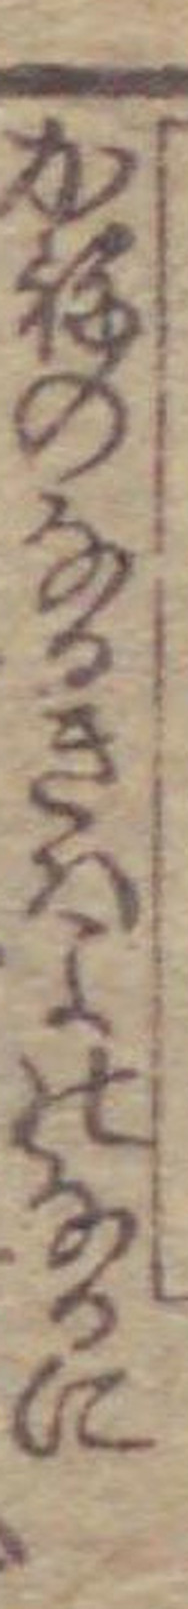かねのなるきはよのなかに
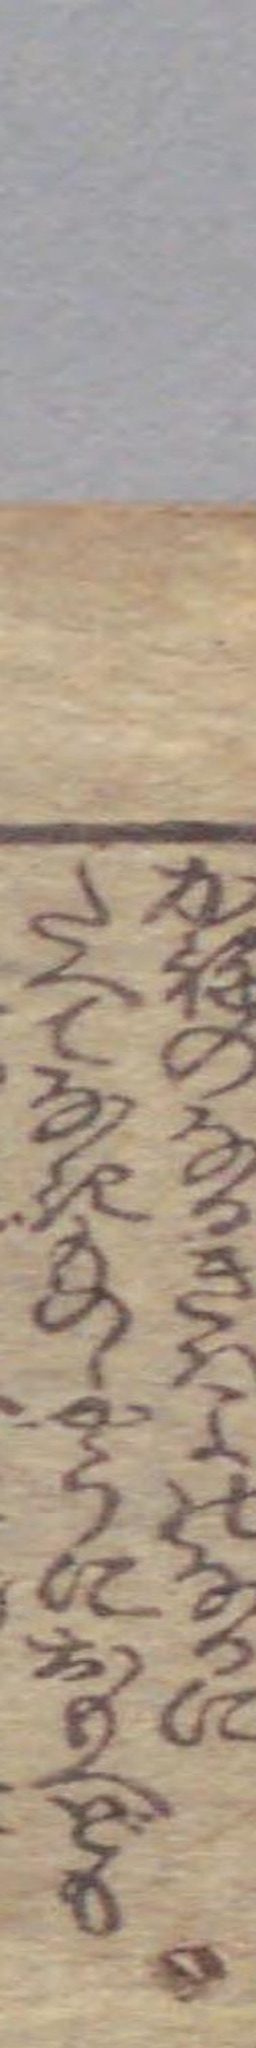たへてなきものゝやうにおもへども
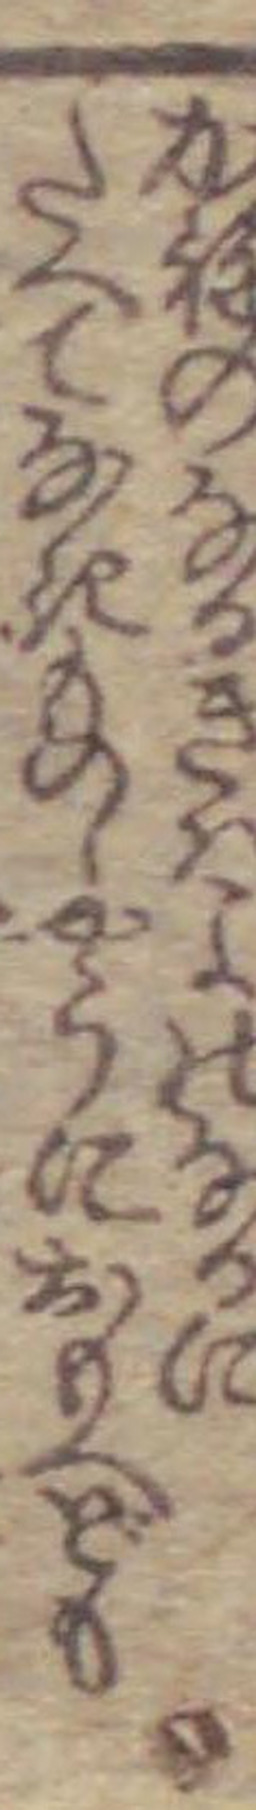たへてなきものゝやうにおもへども
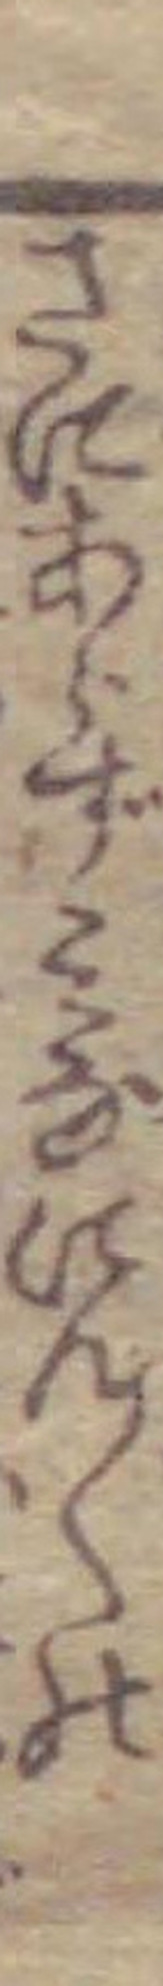さにあらずみなにん〳〵の
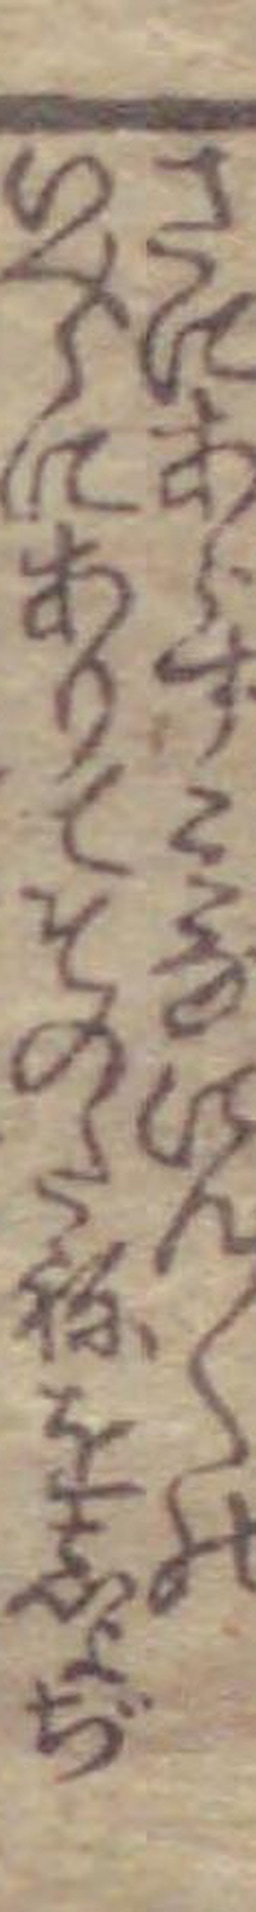いへ〳〵にありてそのたねをしよぢ
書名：化物和本草 : 3巻
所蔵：国立国会図書館 National Diet Library, JAPAN
